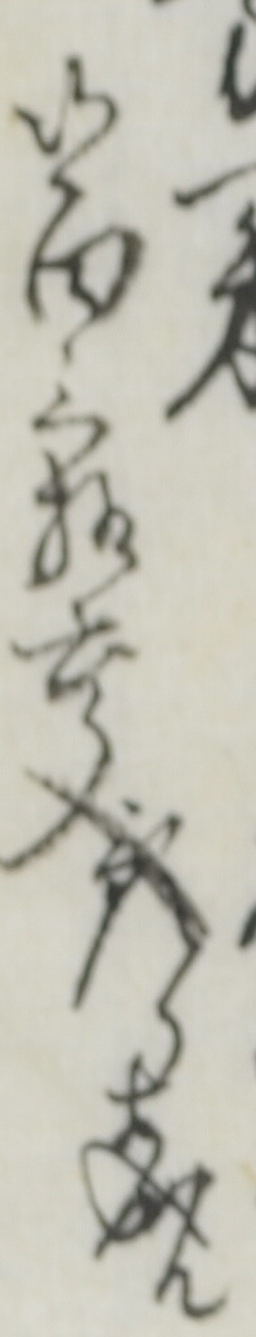弐百三拾六文預り相成ル

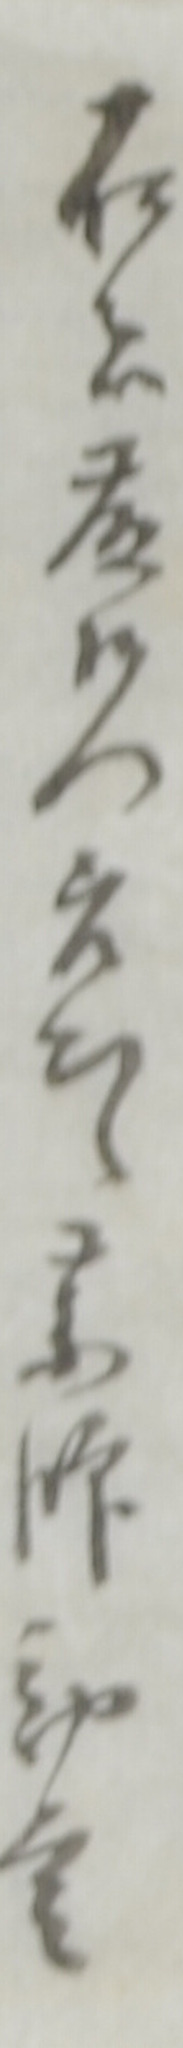右者藤右衛門差出候薬師勘定
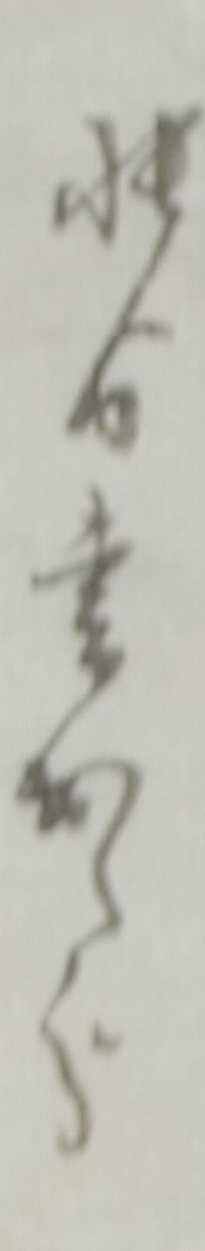帳ゟ書出候分
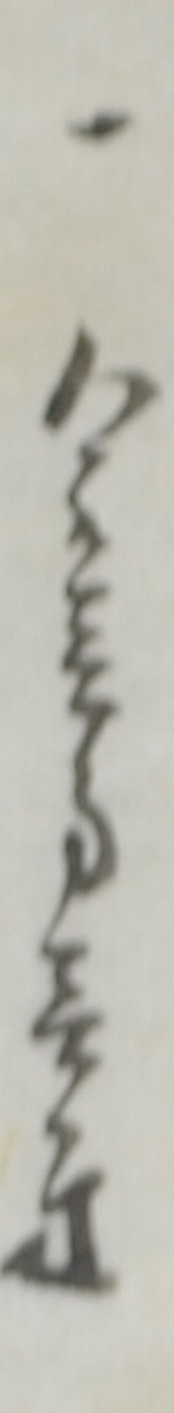一金壱分大工
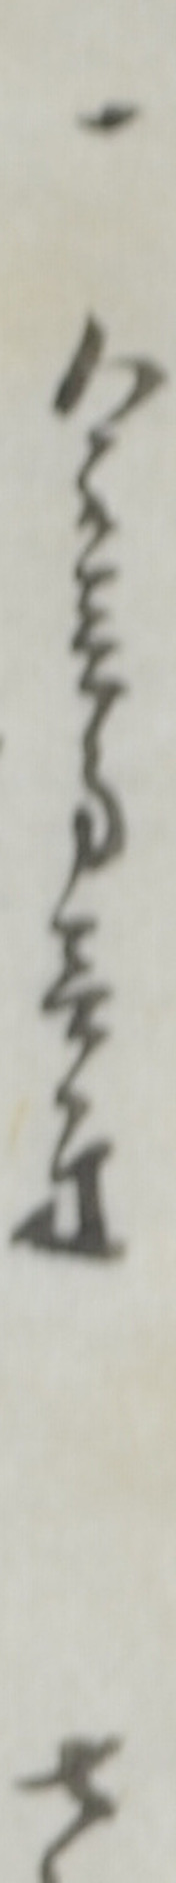一金壱分一朱太七
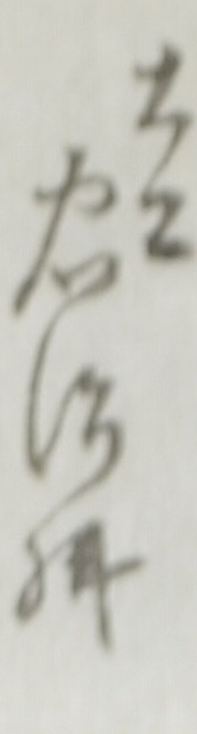忠治払
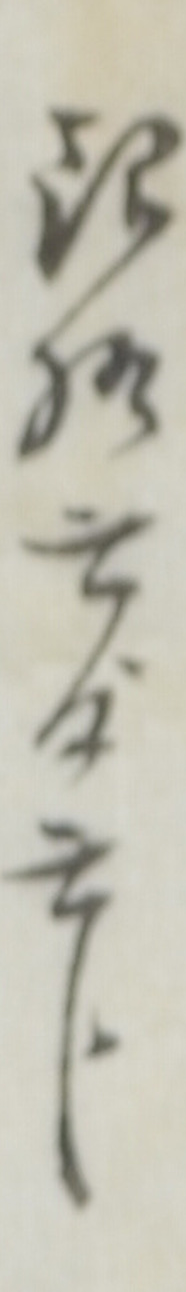銀拾六匁六分
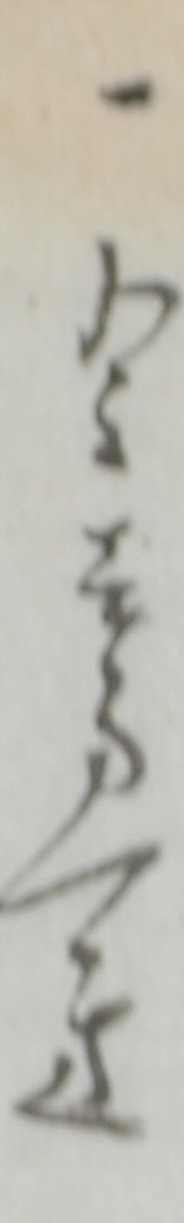一金壱分大工

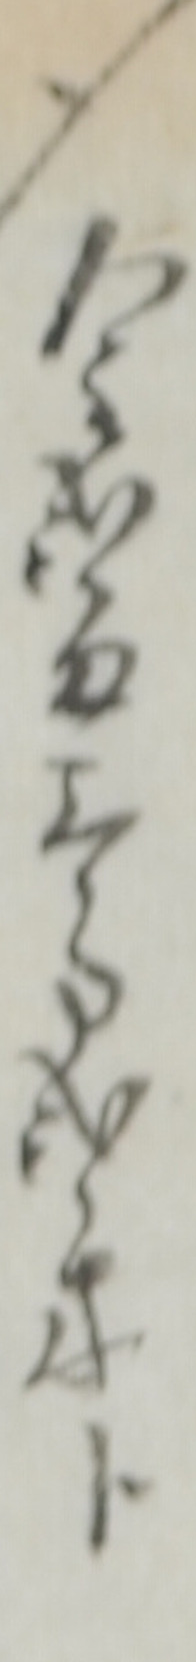〆金弐両壱分弐朱ト
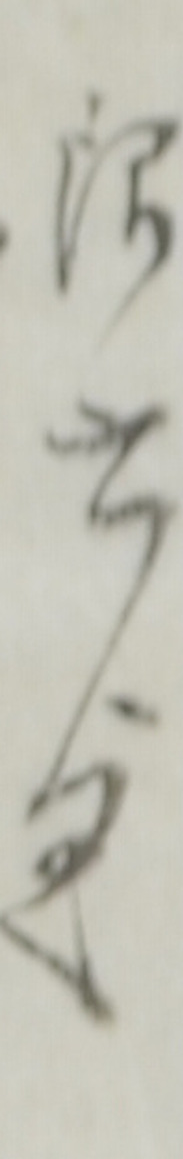銀六匁
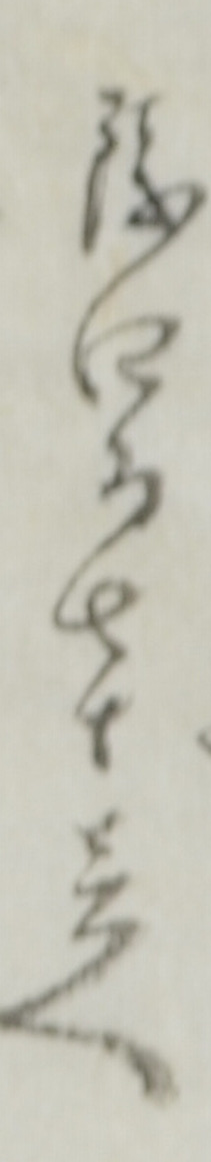銭四百七十壱文
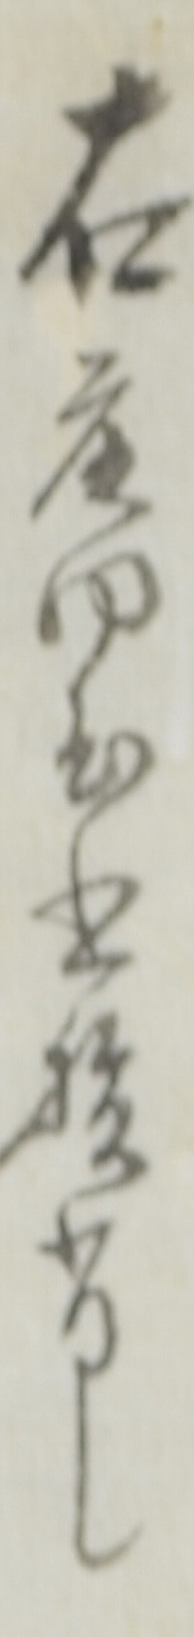庭田屋書抜有之
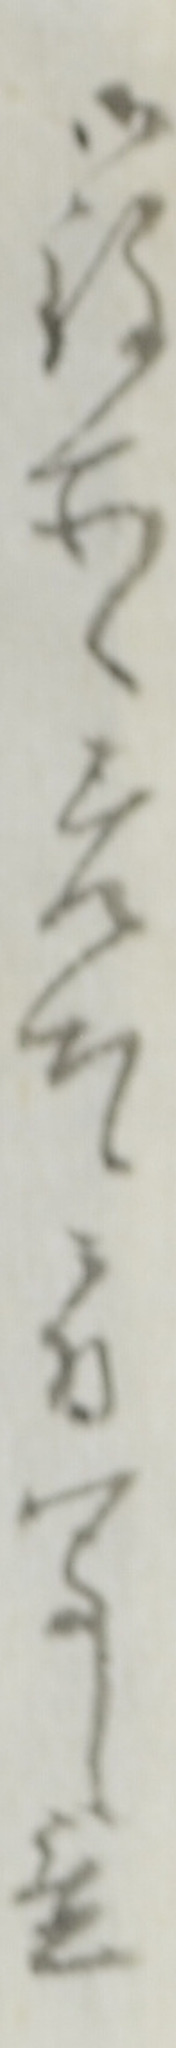御役所へ差出候二付写し置
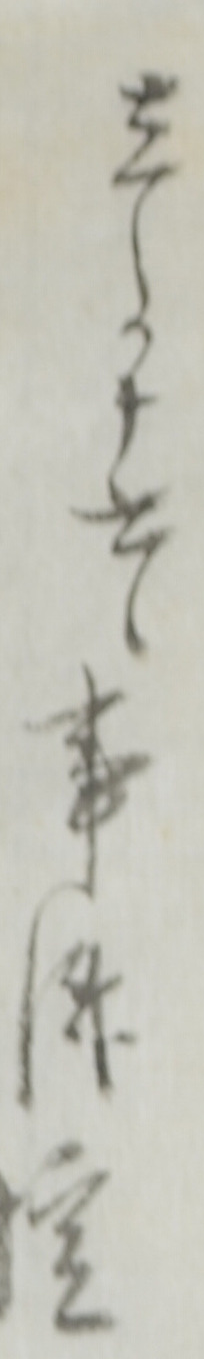七月十六日事済控
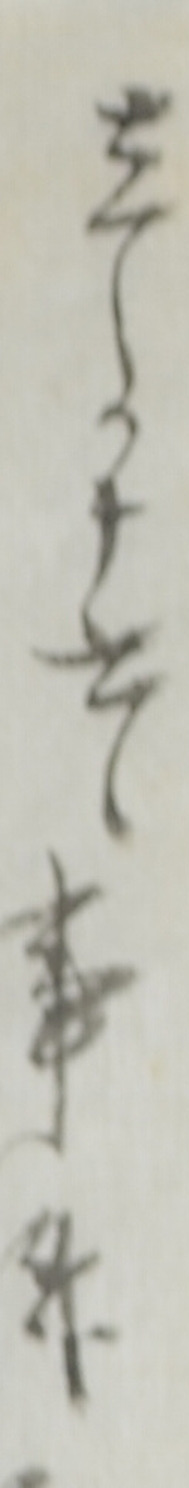七月十六日事済控

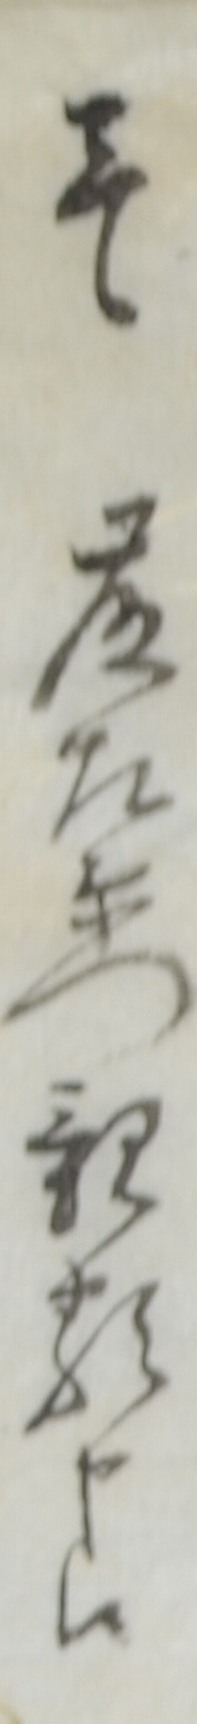壱藤左衛門親類申候
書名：（金銭勘定抜書）
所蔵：伊那市立高遠町図書館・合同会社AMANE
